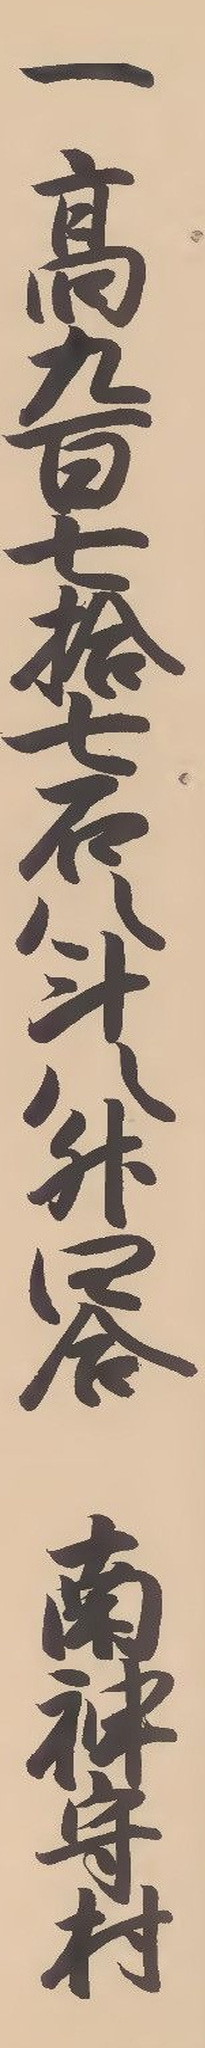一高九百七拾七石八斗八升四合南神守村
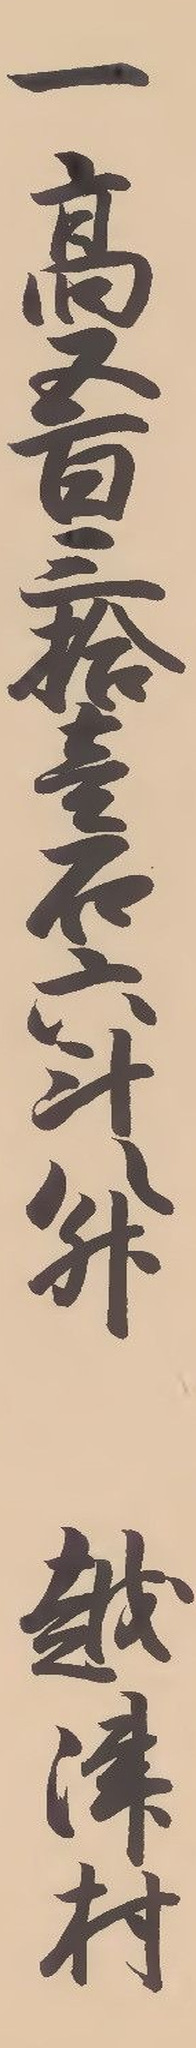一高五百三拾壱石六斗八升越津村
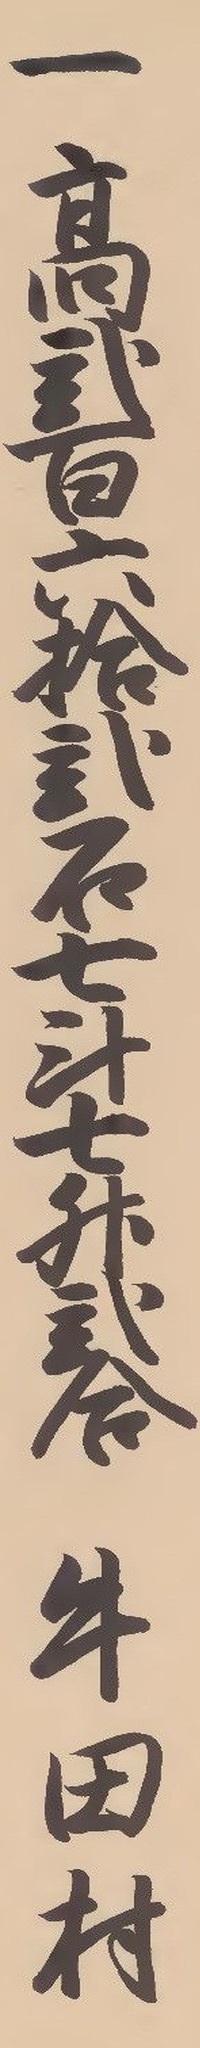一高弐百六拾弐石七斗七升弐合牛田村
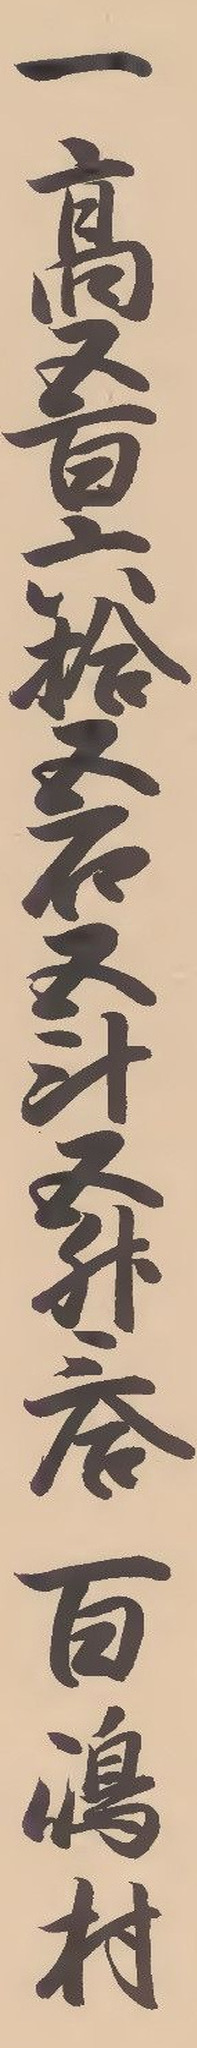一高五百六拾五石五斗五升三合百島村

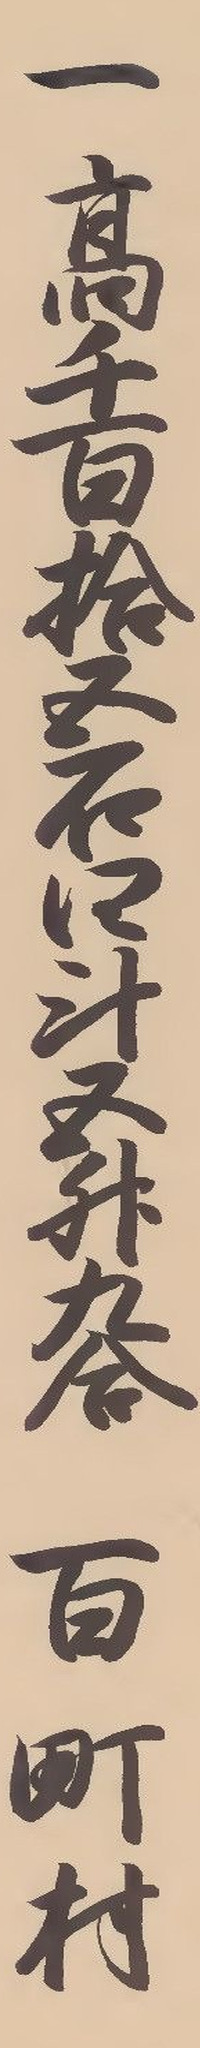一高千百拾五石四斗五升九合百町村
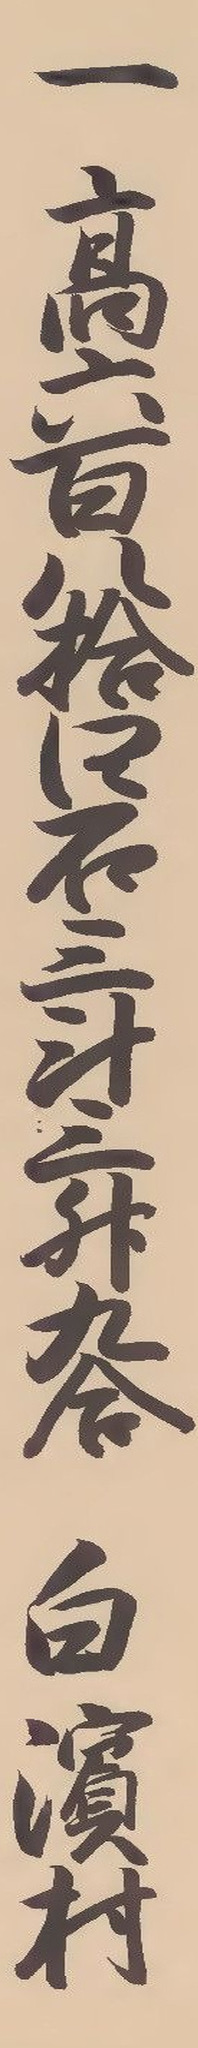一高六百八拾四石三斗三升九合白浜村
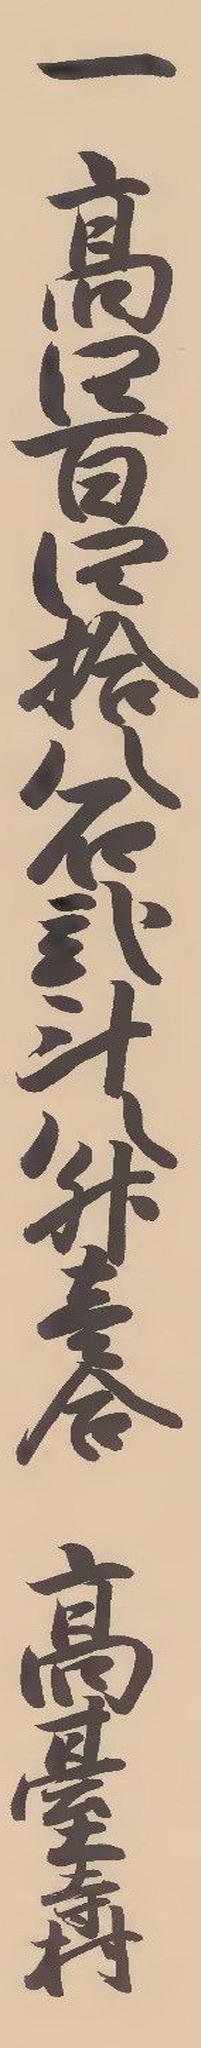一高四百四拾八石弐斗八升壱合高台寺村
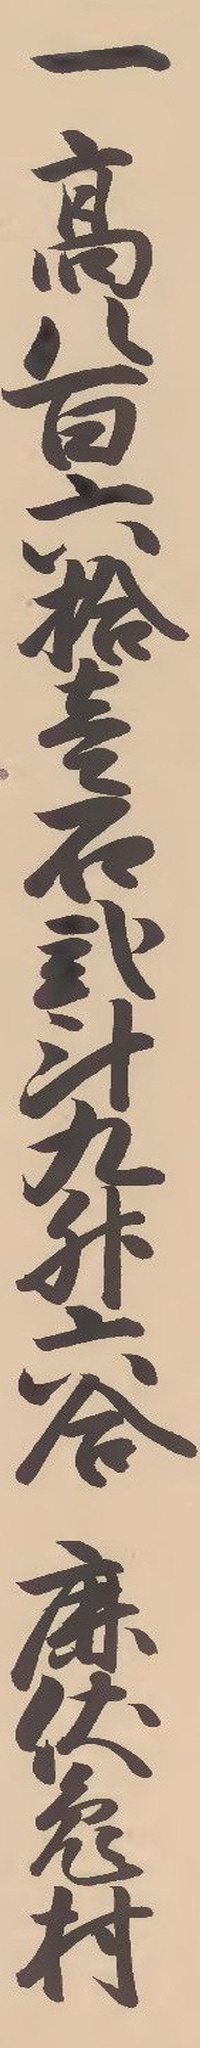一高八百六拾壱石弐斗九升六合鹿伏兎村
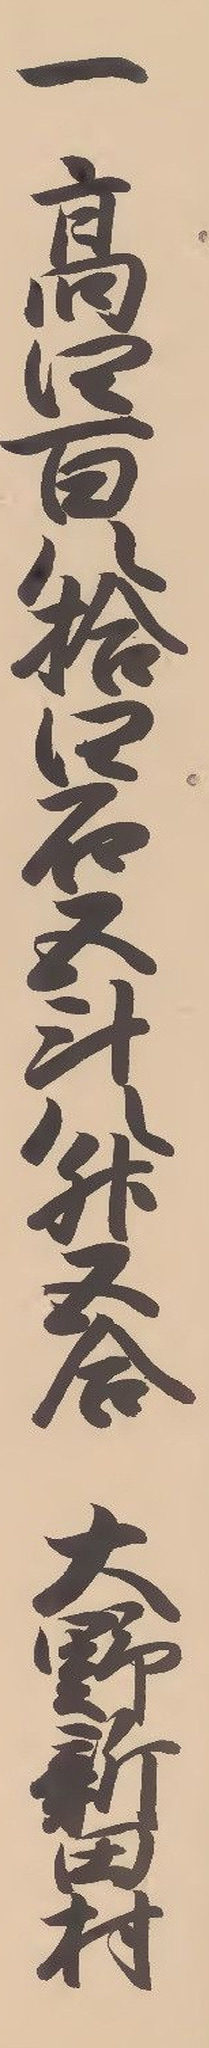一高四百八拾四石五斗八升五合大野新田村
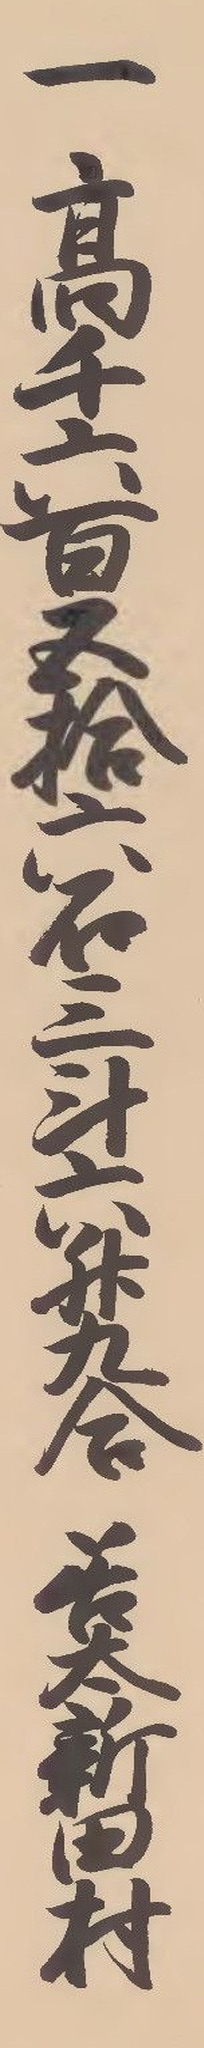一高千六百五拾六石三斗六升九合善太新田村
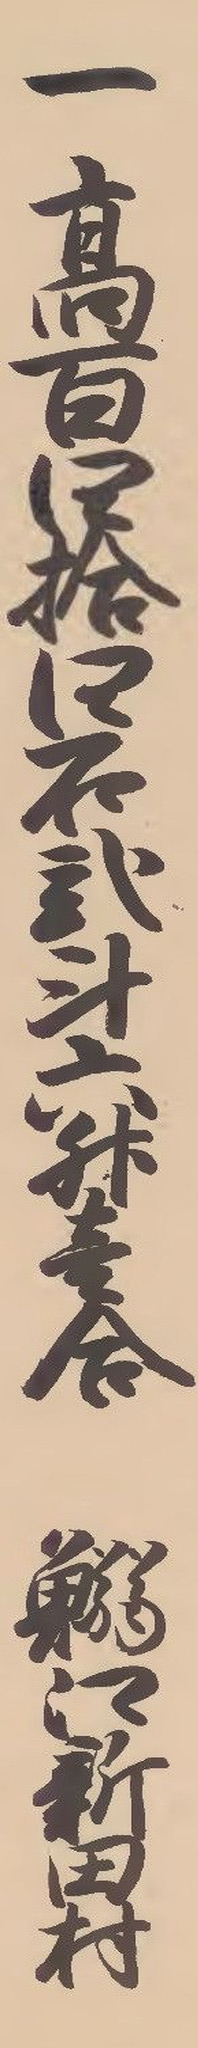一高百四拾四石弐斗六升壱合鰯江新田村
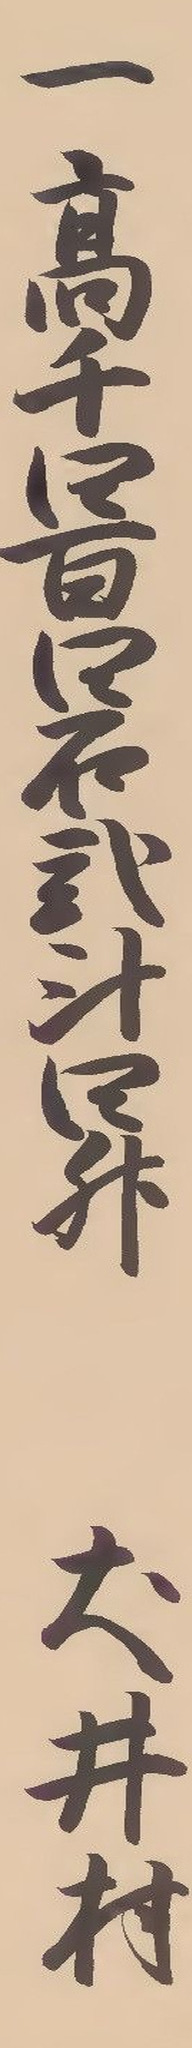一高千四百四石弐斗四升犬井村

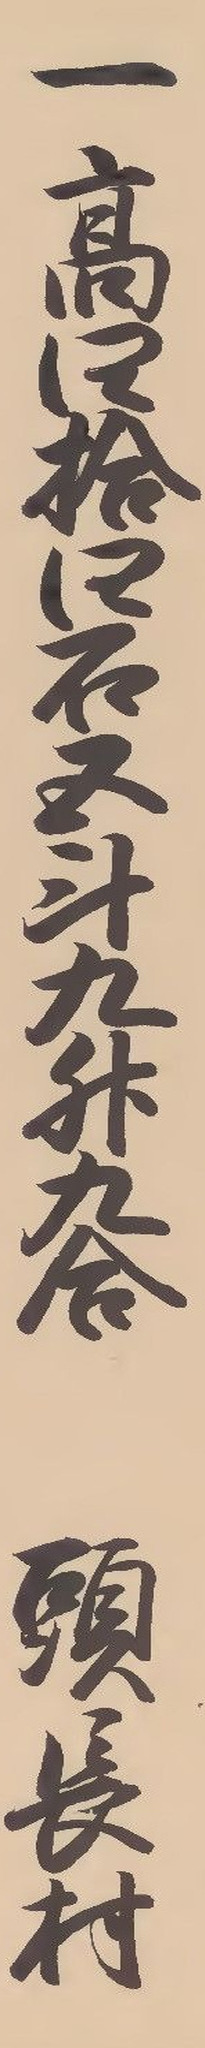一高四拾四石五斗九升九合頭長村
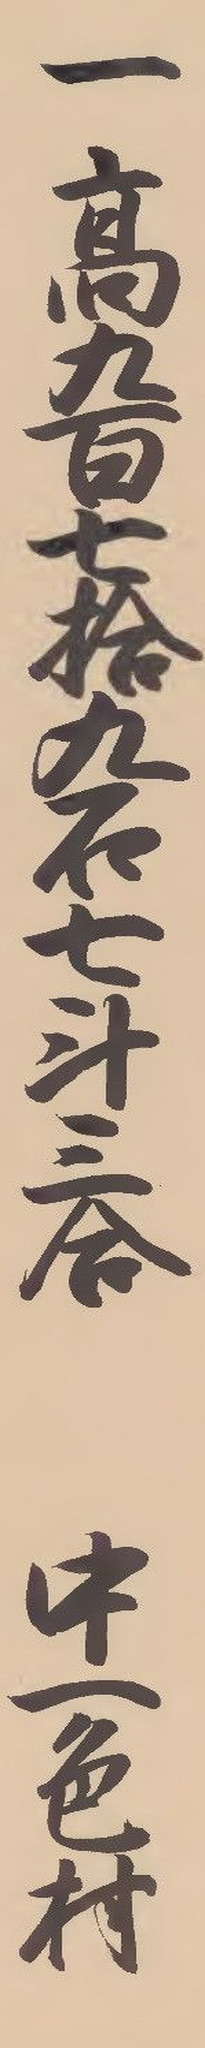一高九百七拾九石七斗三合中一色村
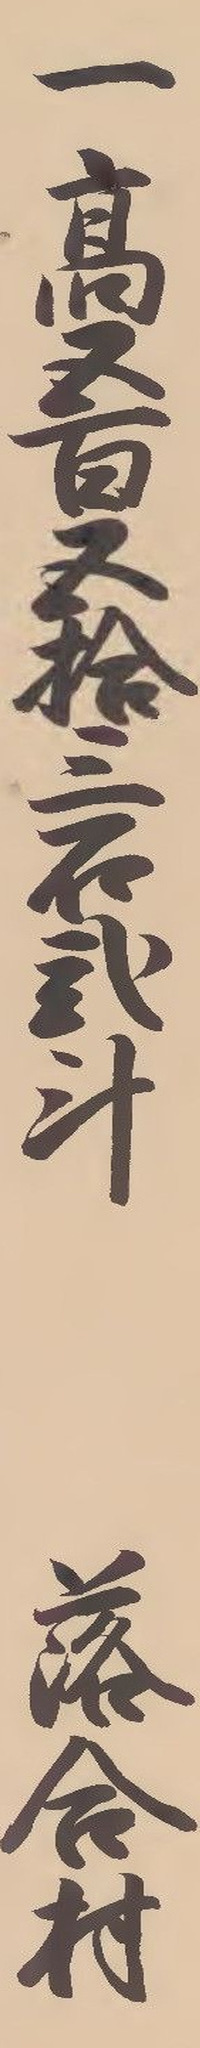一高五百五拾三石弐斗落合村
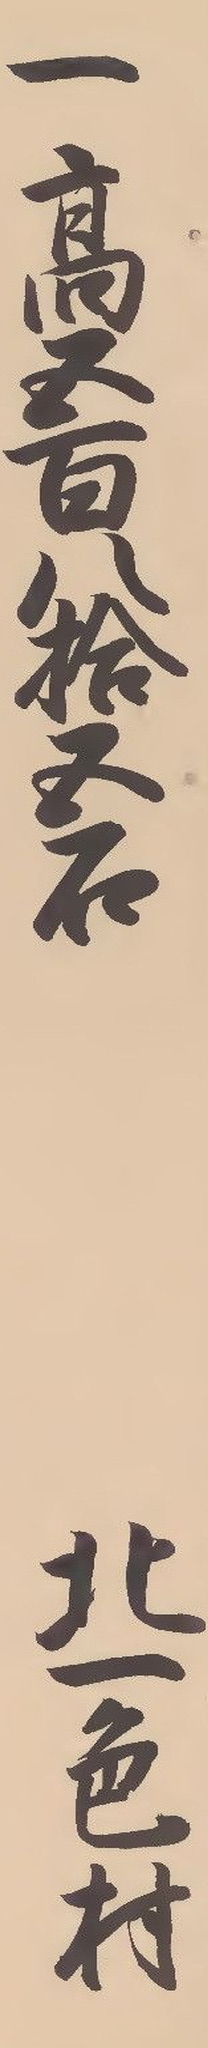一高五百八拾五石北一色村
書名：尾張国郷帳
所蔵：国立公文書館 National Archives of Japan
